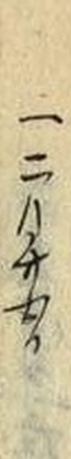一二月廿五日
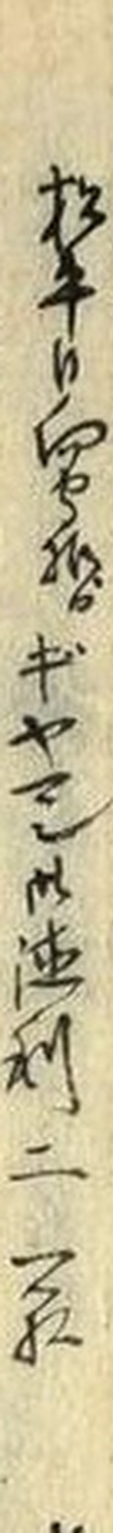松平日向守様ゟギヤマン御徳利二一箱御到来
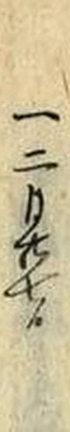一二月廿七日
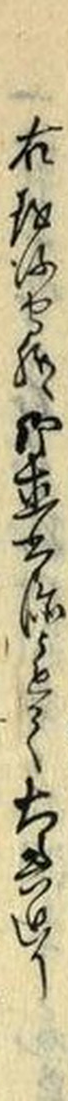右越後守様へ御直書添被進之大奥廻り
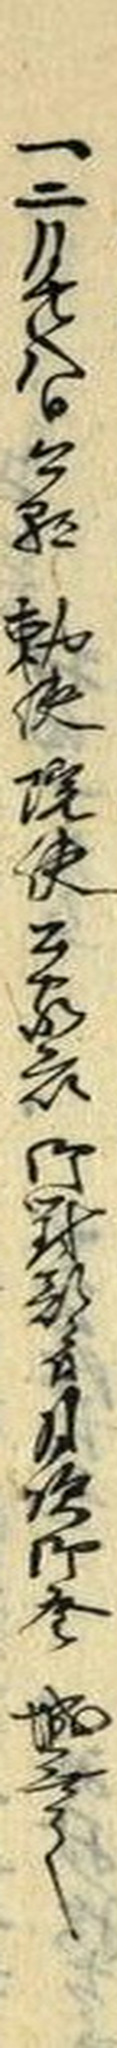一二月廿八日今朝勅使院使公家衆御対顔ニ付月次御登城無之
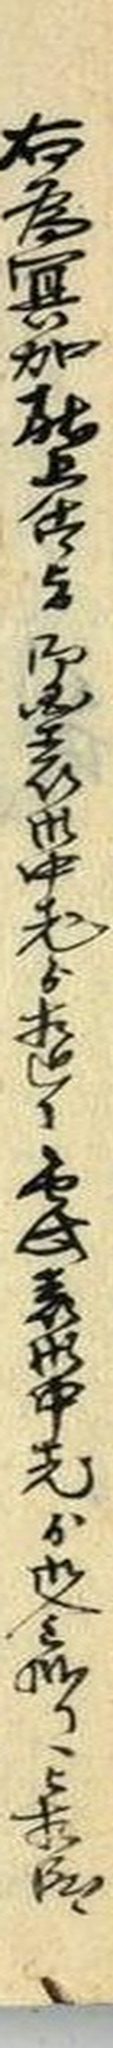右為冥加献上仕候旨御国表御中老ゟ相廻り候由此表御中老ゟ御金掛りへ被相渡候
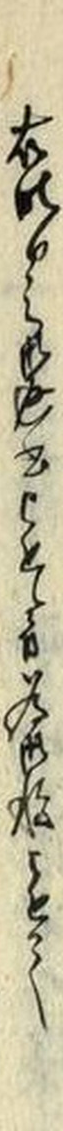右昨日之御返書被進候ニ付為御移り被進之
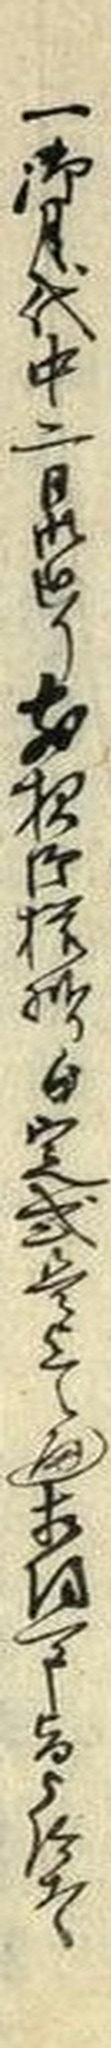一御月代中二日御廻り前夜御櫛掛りゟ定式是迄之通相伺可申旨被仰出候
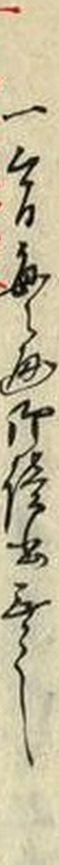一今日毎々通御読書無之
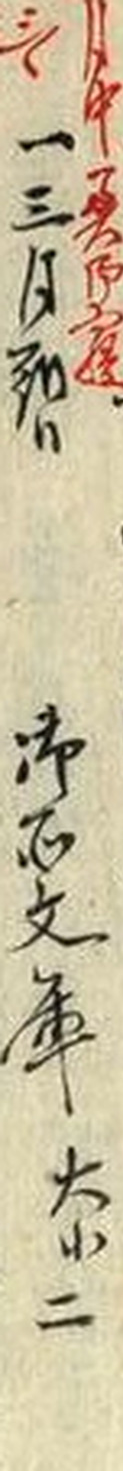一三月朔日御所文庫大小二
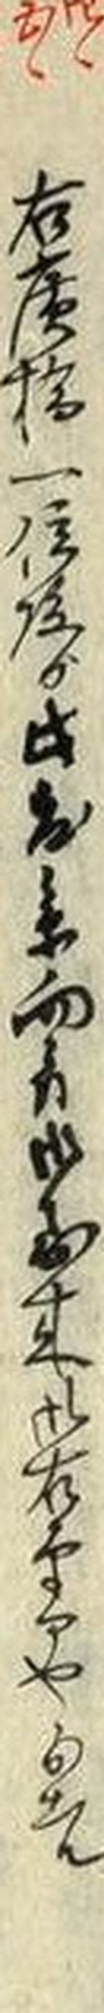右広橋一位殿ゟ此度参向ニ付御到来御右筆部やゟ出ㇽ
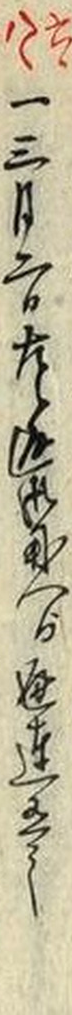一三月二日左之通御用人ゟ通達有之
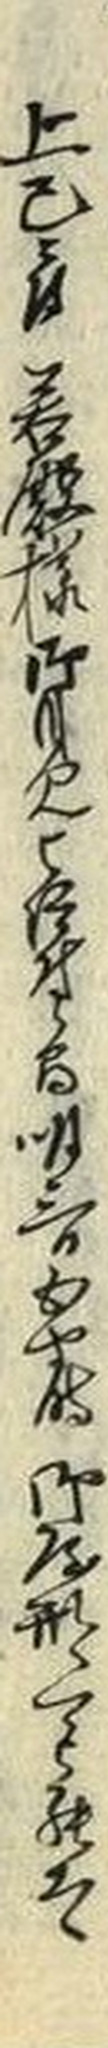上巳ニ付若殿様御目見被仰付候間明三日五半時御屋形へ可被罷出候
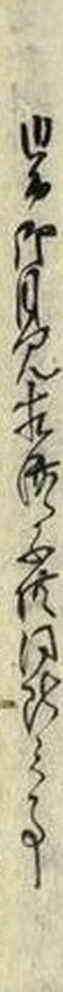追而御目見相済候子供同断之事
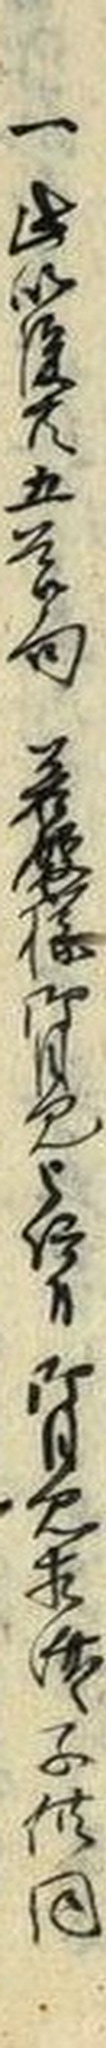一此以後共五節句若殿様御目見被仰付御目見相済子供同
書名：少傅日録抄（斉承付側向頭取日記、在府）
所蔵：福井県文書館 Fukui Prefectural Archives
